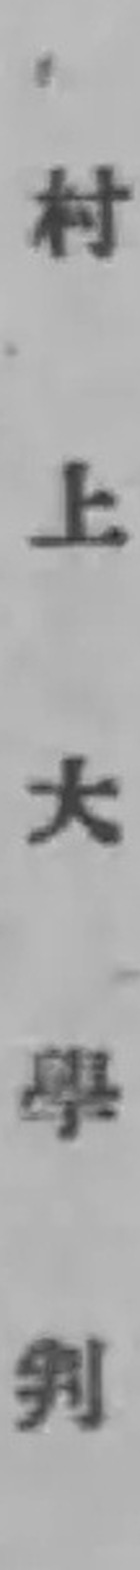村上大学判
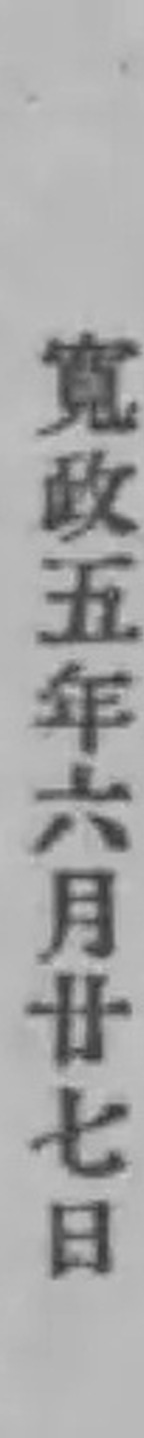寛政五年六月廿七日
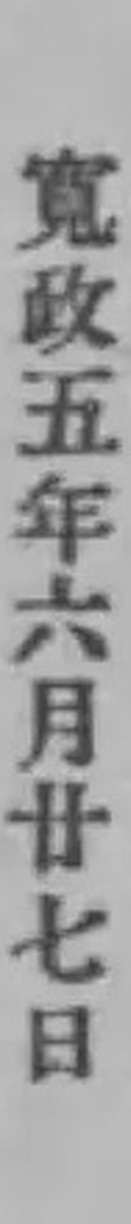寛政五年六月廿七日
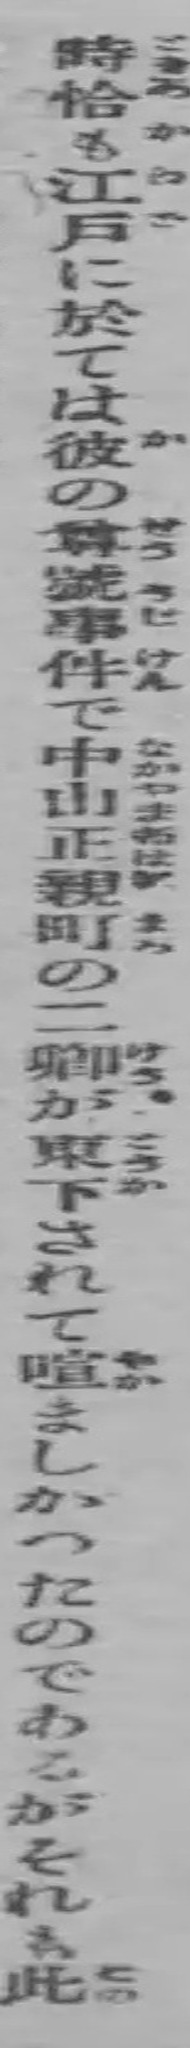時宛も江戸に於ては彼の尊号事件で中山正親町の二卿が東下されて喧ましかつたのであるがそれも此
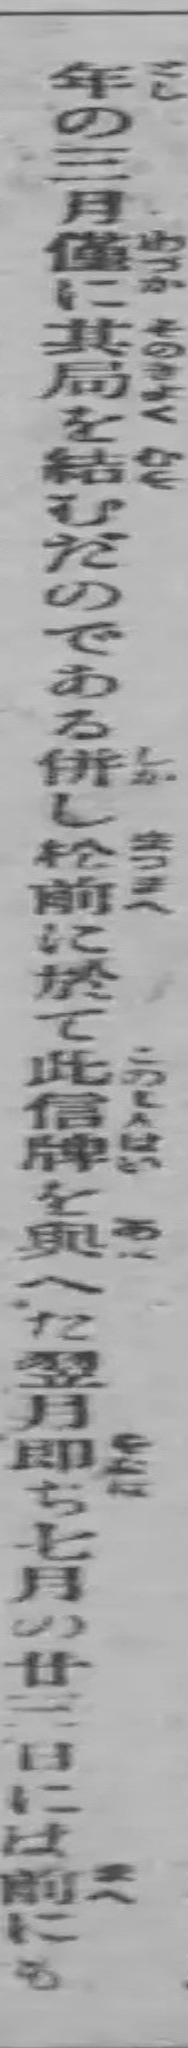年の三月僅に其局を結むだのである併し松前に於て此信牌を与へた翌月即ち七月の廿三日には前にも
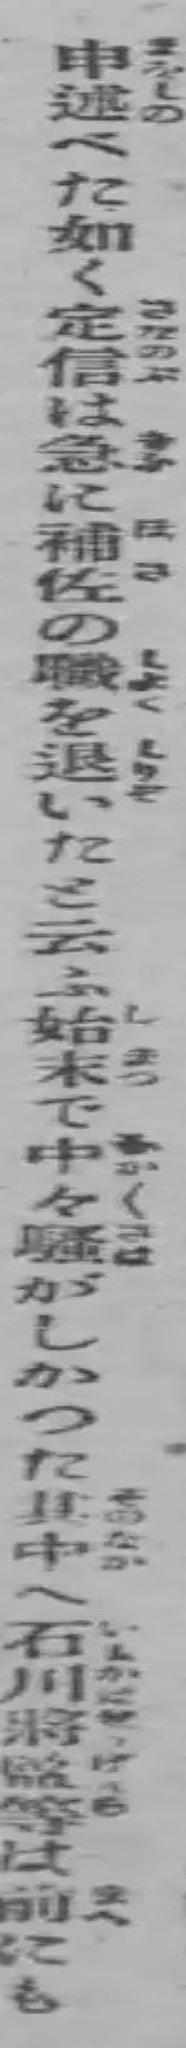申述べた如く定信は急に補佐の職を退いたと云ふ始末で中々騒がしかつた其中へ石川将監等は前にも
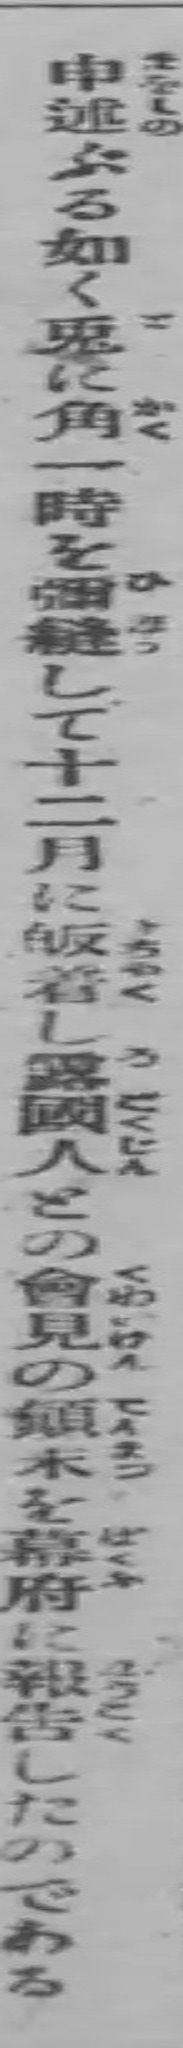申述ぶる如く兎に角一時を彌縫して十二月に皈着し露国人との会見の顛末を幕府に報告したのである
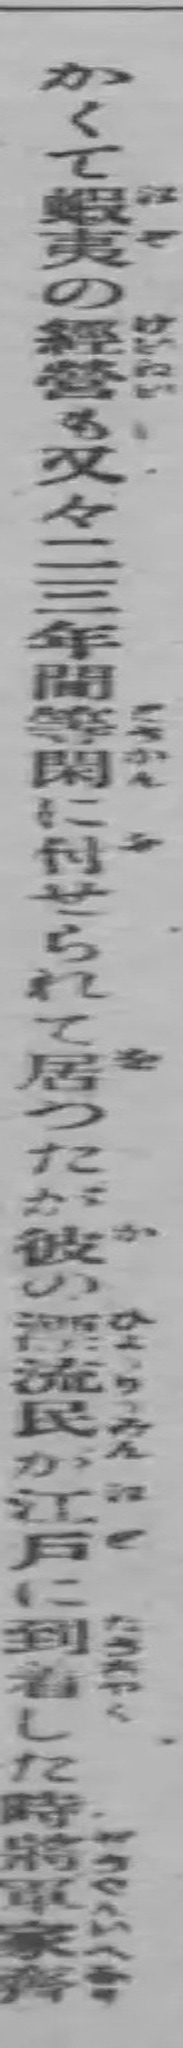かくて蝦夷の経営も又々二三年間等閑に付せられて居つたが彼の漂流民が江戸に到着した時将軍家斉
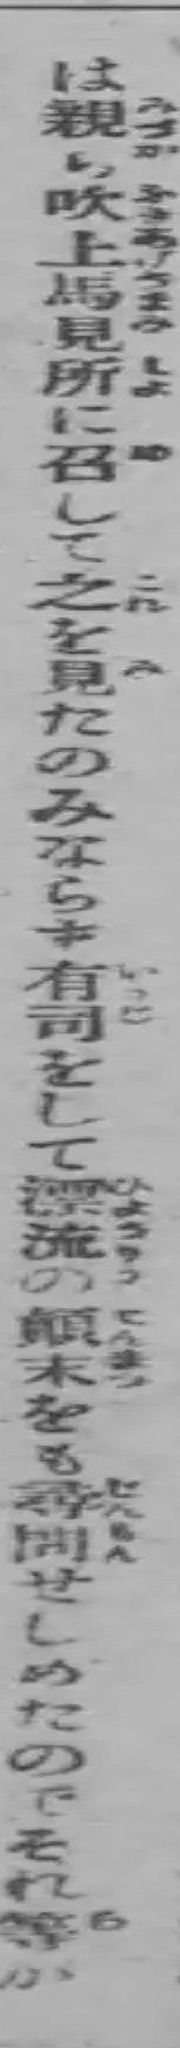は親ら吹上馬見所に召して之を見たのみならず有司をして漂流の顛末をも尋問せしめたのでそれ等が

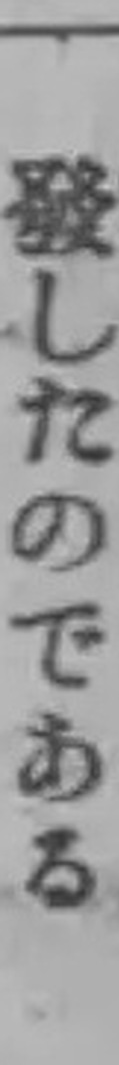発したのである
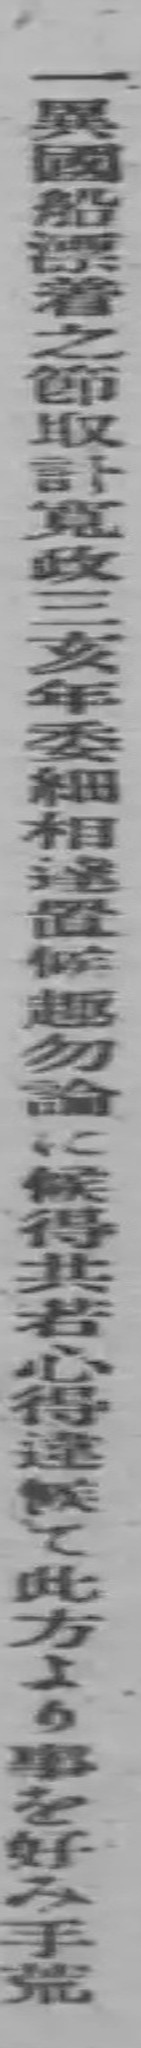一異国船漂着之節取計寛政三亥年委細相達置候趣勿論に候得共若心得違候て此方より事を好み手荒
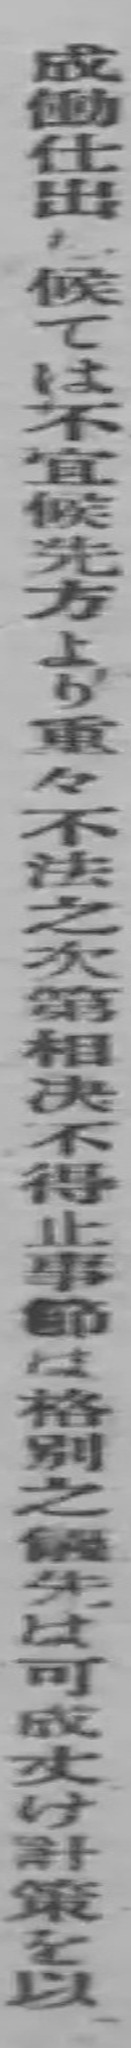成働仕出し候ては不宜候先方より重々不法之次第相決不得止事節は格別之儀先は可成丈け計策を以
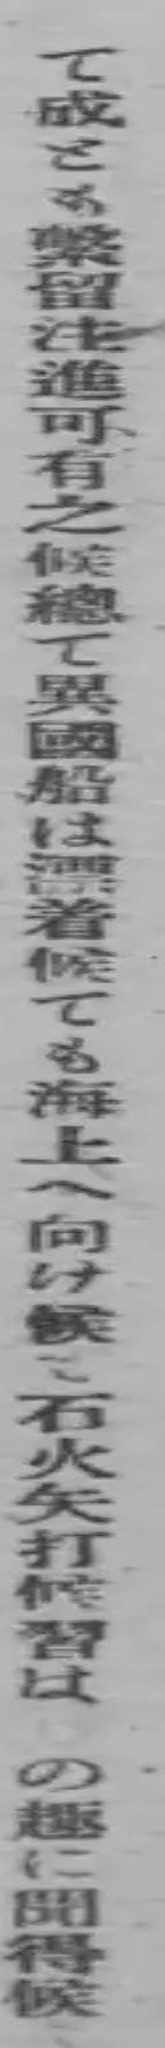て成とも繋留注進可有之候総て異国船は漂着候ても海上へ向け候て石火矢打候習はの趣に聞得候
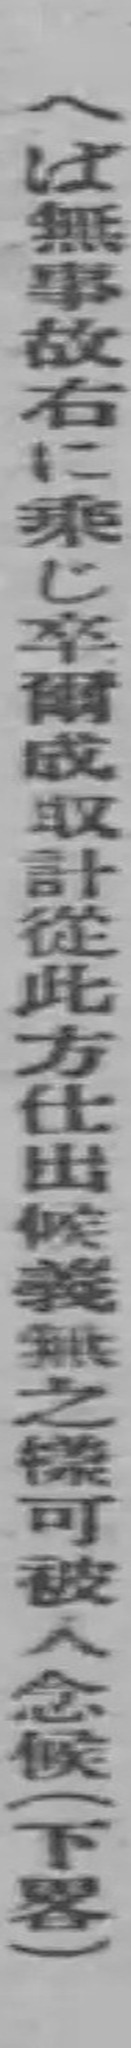へば無事故右に乗じ卒爾成取計従此方仕出候義無之様可被入念候(下略)
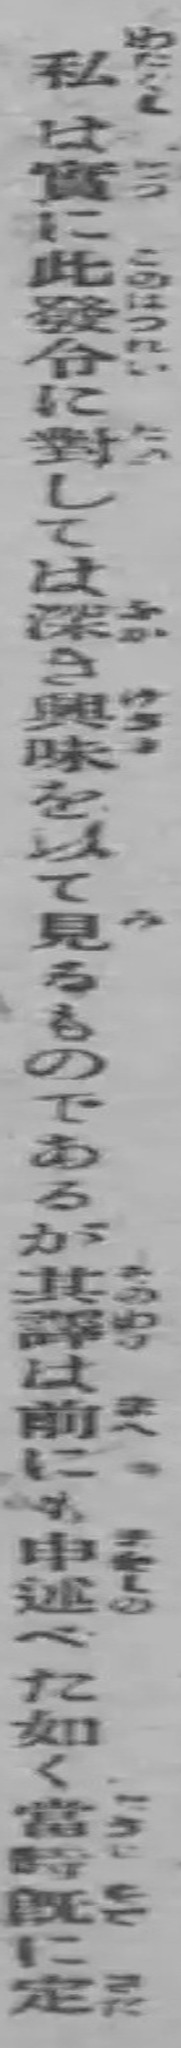私は実に此発令に対しては深き興味を以て見るものであるが其訳は前にも申述べた如く当時既に定
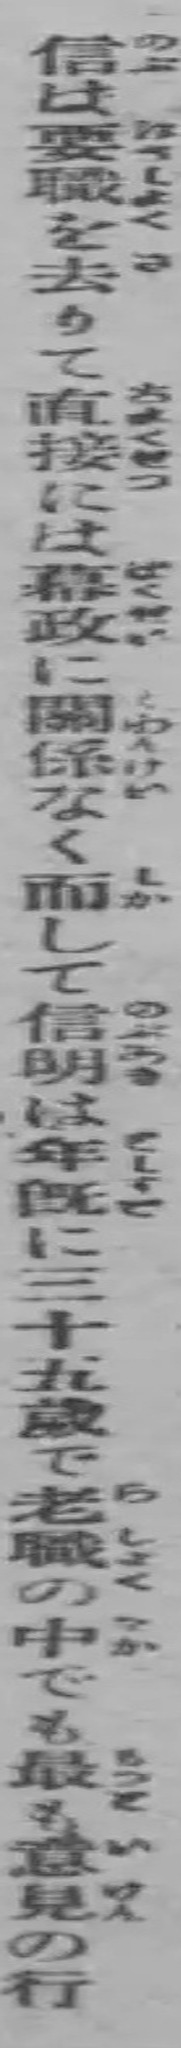信は要職を去りて直接には幕政に関係なく而して信明は年既に三十五歳で老職の中でも最も意見の行
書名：豊橋市史談
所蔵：国立国会図書館 National Diet Library, JAPAN
